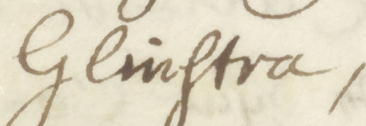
Glinstra,
